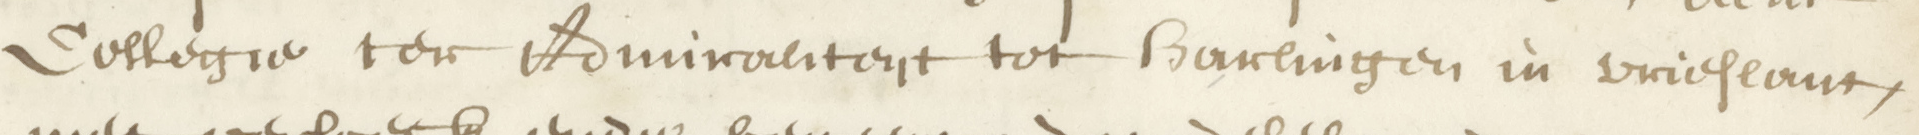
Collegie ter Admiraliteyt tot Harlingen in vrieslant,
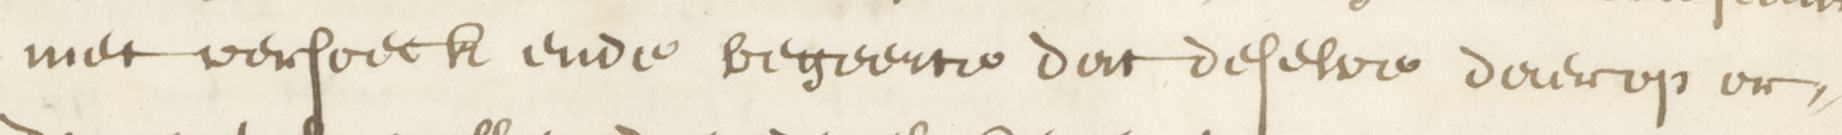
met versoeck ende begeerte dat deselve daerop or„
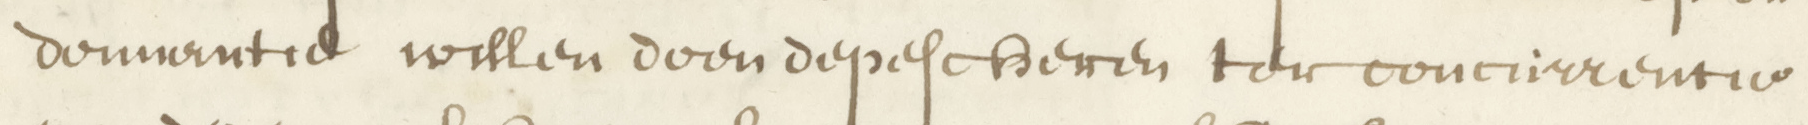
donnantie willen doen depescheren ter concurrentie
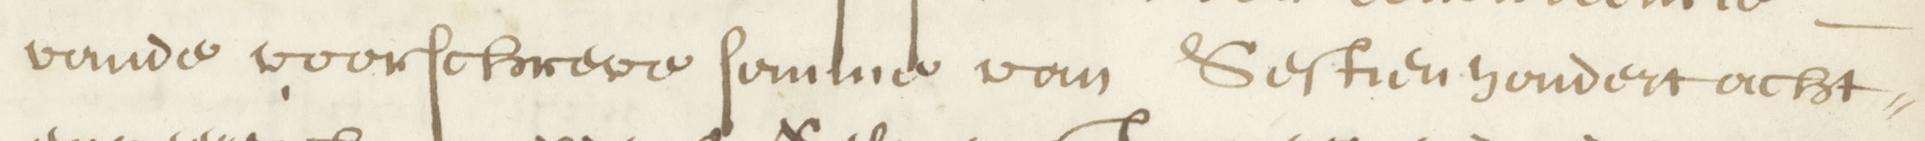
vande voorschreve somme van Sestien hondert acht„
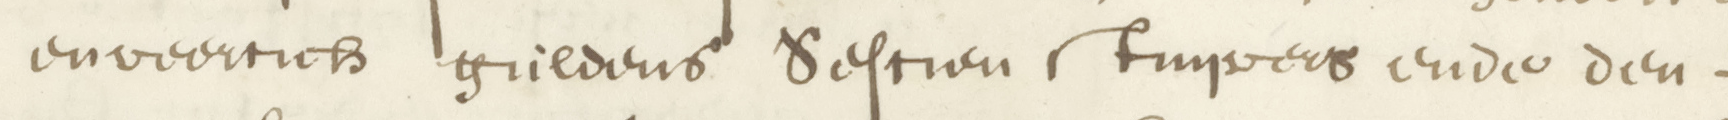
enveertich guldens Sestien stuyvers ende den
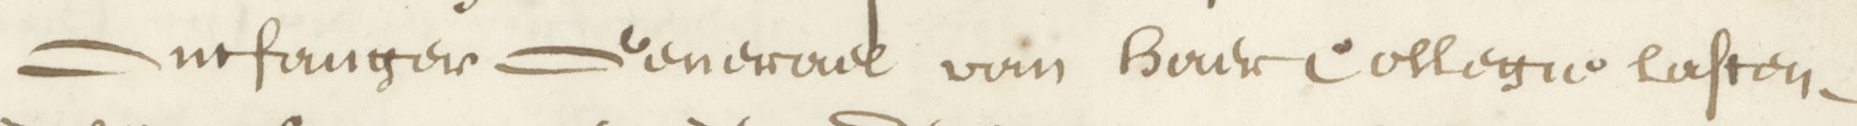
Ontfanger Generael van Haer Collegie lasten
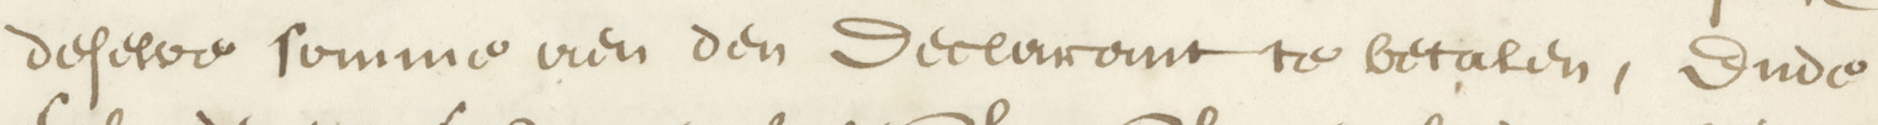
deselve somme aen den Declarant te betalen. Ende
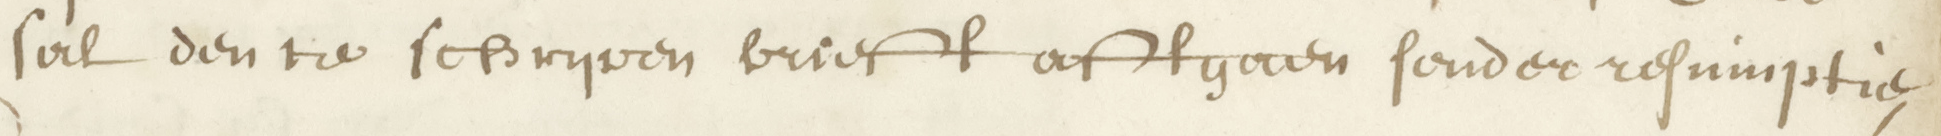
sal den te schryven brieff affgaen sonder resumptie.
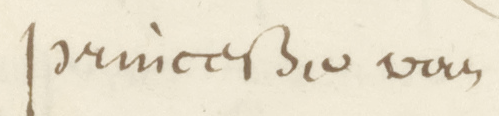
Princesse van
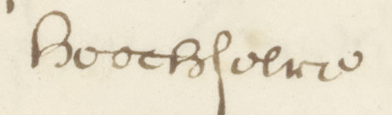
Hoochsolre
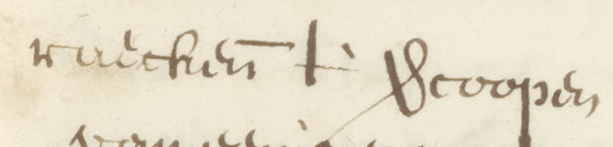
raecken t' vcoopen
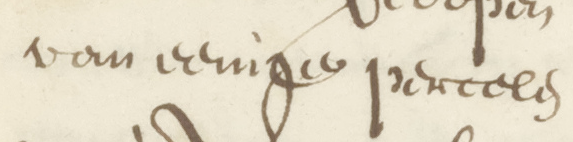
van eenige percelen
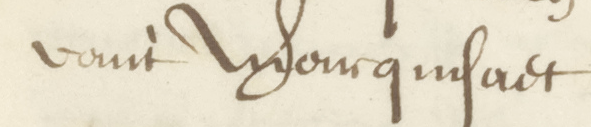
vant' Marquisaet
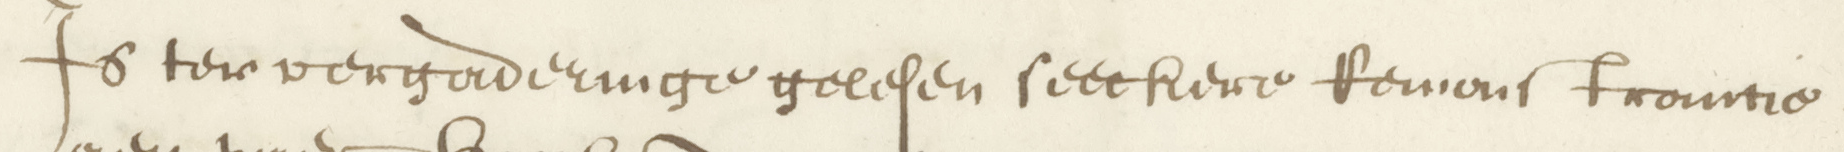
Is ter vergaderinge gelesen seeckere Remonstrantie
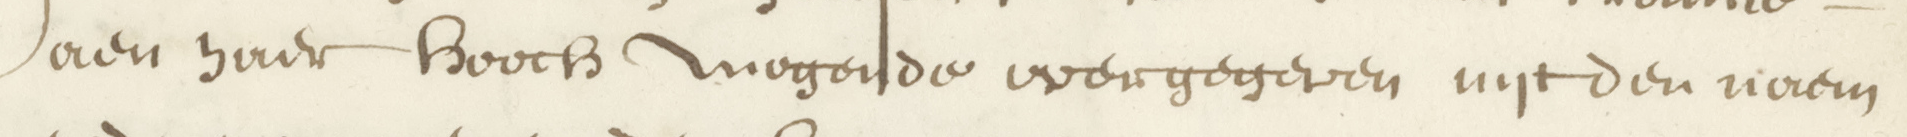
aen haer Hooch Mogende overgegeven uyt den naem
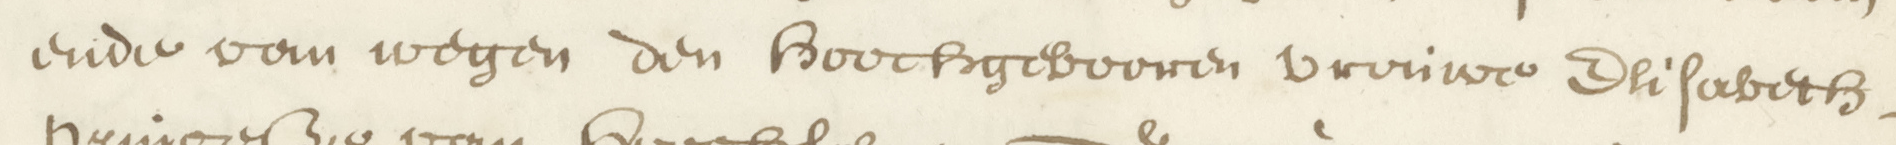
ende van wegen den Hoochgebooren vrouwe Elisabeth
